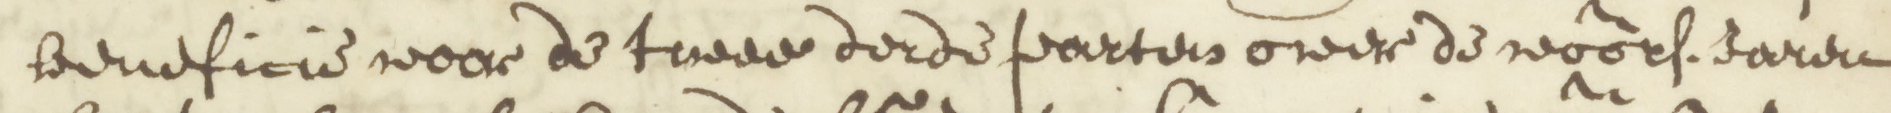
beneficie voor de twee derde parten over de voors. Jaren
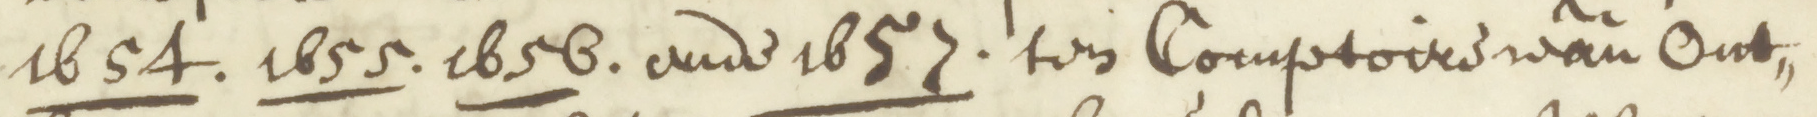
1654. 1655. 1656. ende 1657. ten Comptoire van Ont„
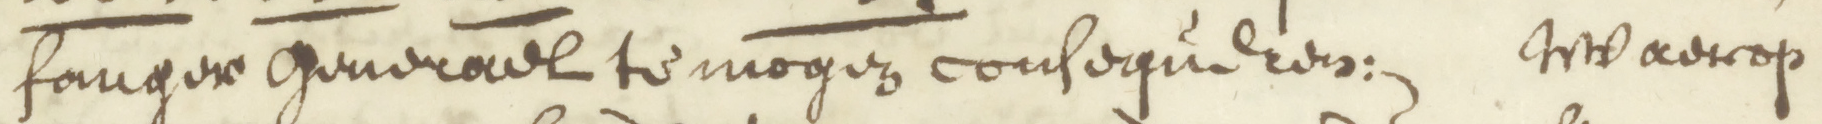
fanger Generael te mogen consequeren: Waerop
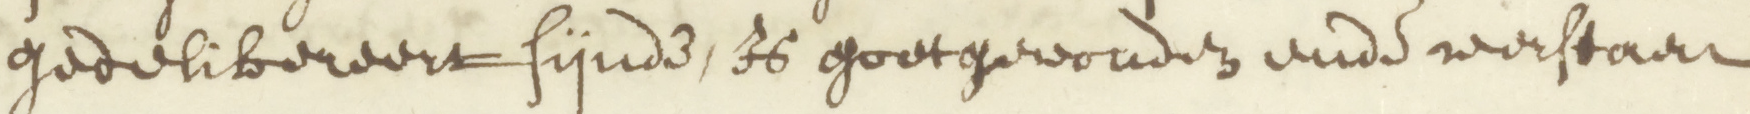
gedelibereert sijnde, Is goetgevonden ende verstaen
